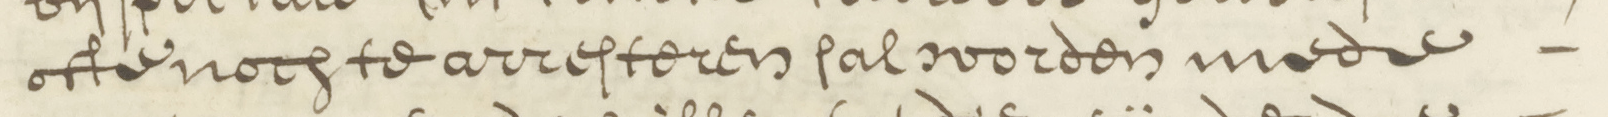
ofte noch te arresteren sal worden mede -
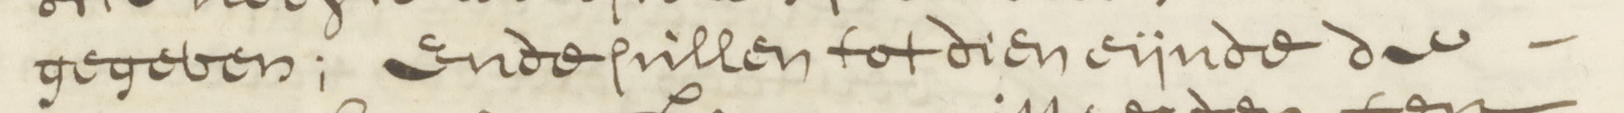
gegeven; Ende sullen tot dien eijnde de -
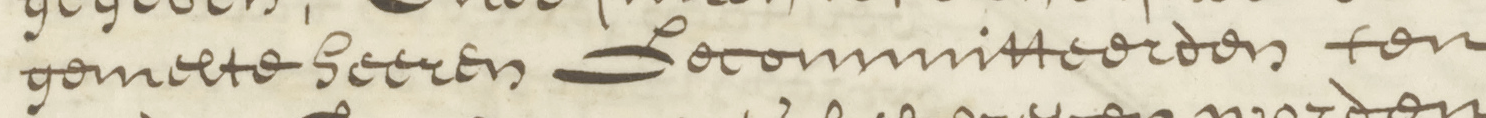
gemelte heeren Gecommitteerden ten
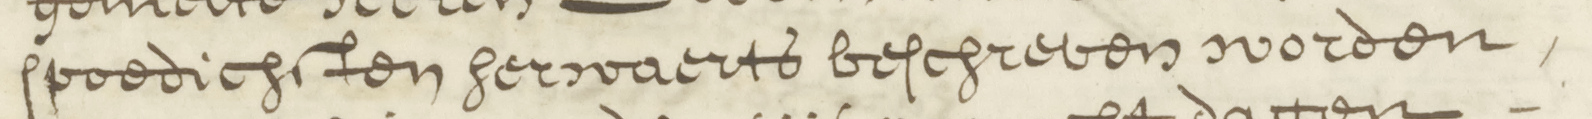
spoedichsten herwaerts beschreven worden,
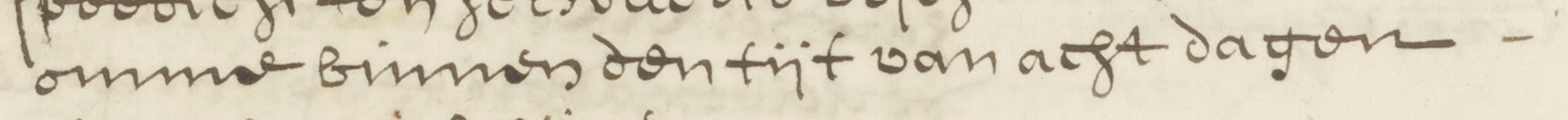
omme binnen den tijt van acht dagen -
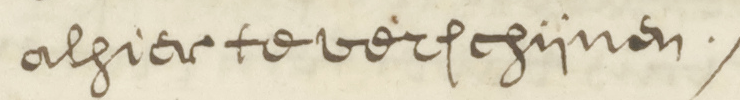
alhier te verschijnen.
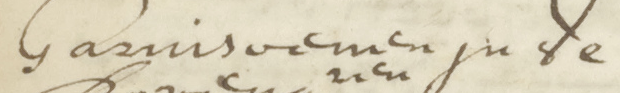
Garnisoenen in de
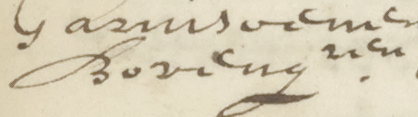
Bovenqren.
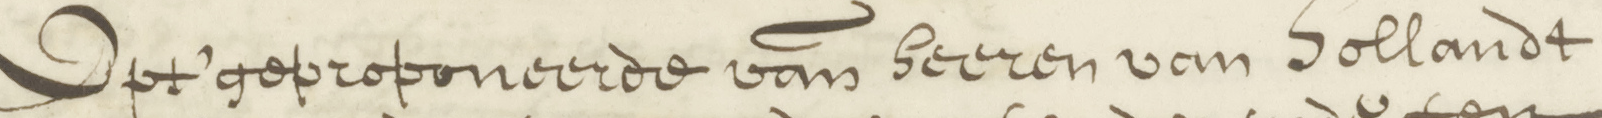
Opt' geproponeerde van heeren van Hollandt
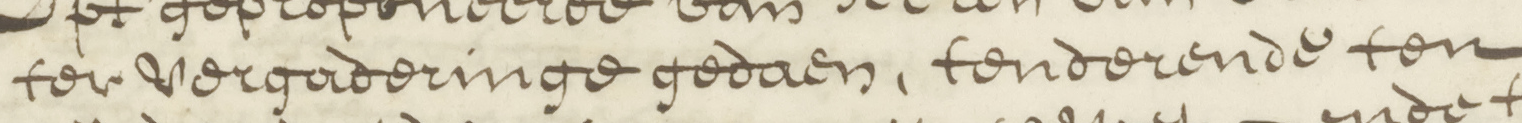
ter vergaderinge gedaen, tenderende ten
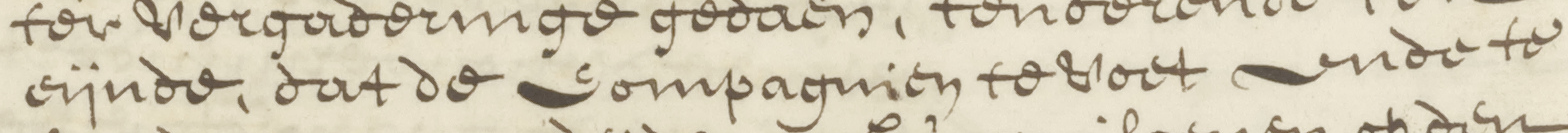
eijnde, dat de Compagnien te voet ende te
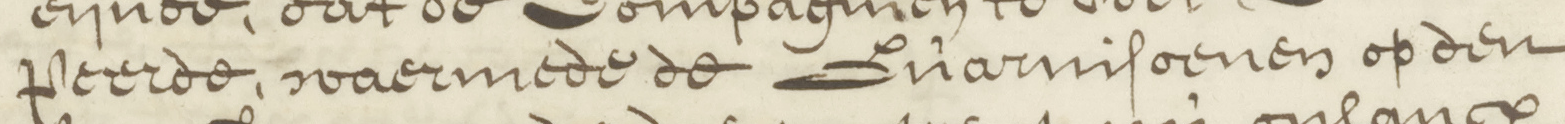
Peerde, waermede de Guarnisoenen op den
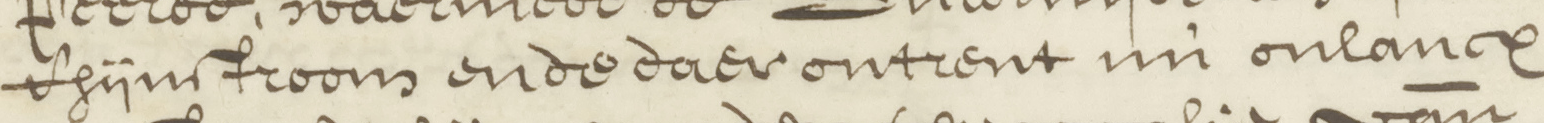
Rhijnstroom ende daer ontrent nu onlancx
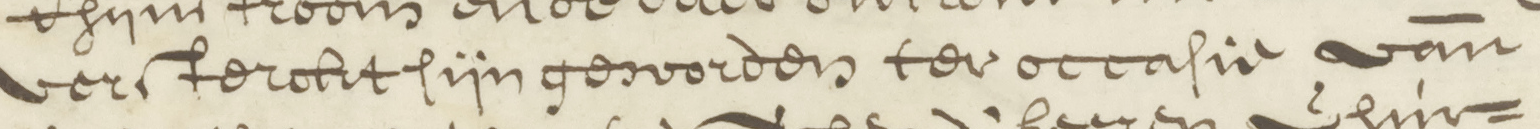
versterckt sijn geworden ter occasie van
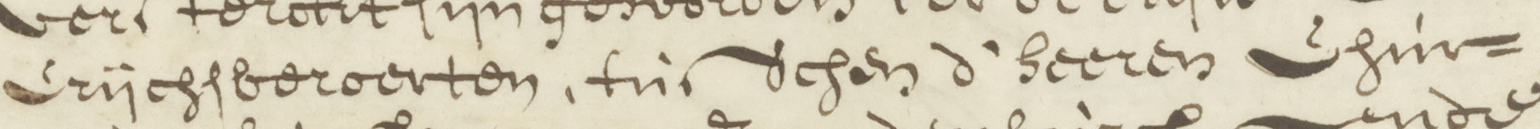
Crijchsberoerten, tusschen d'heeren Chur-
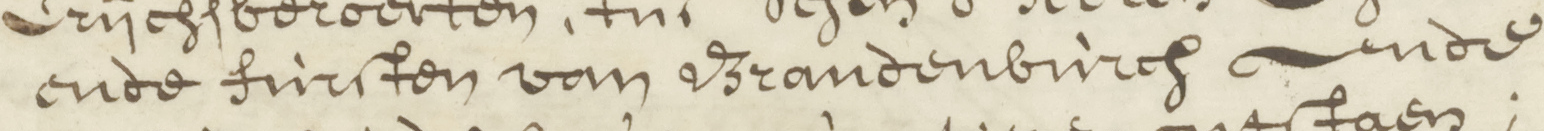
ende fursten van Brandenburch ende
